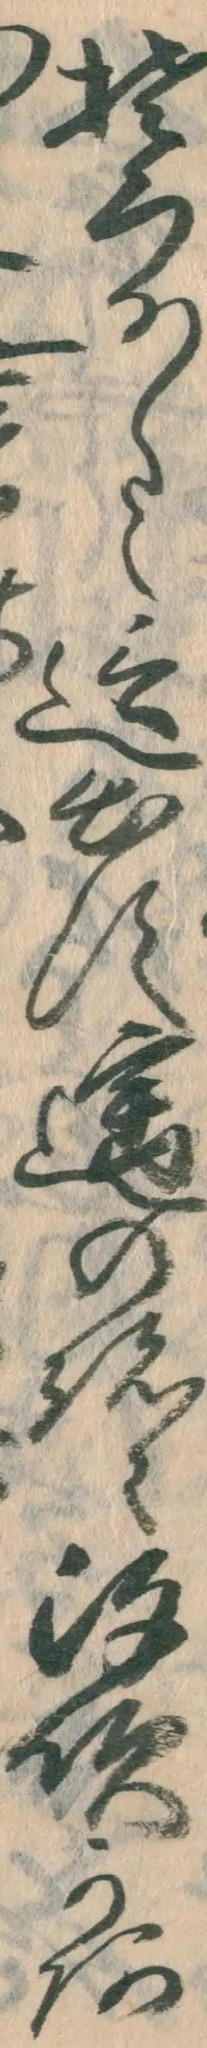そこかしこ這出す遥の渚に汐吹かあ
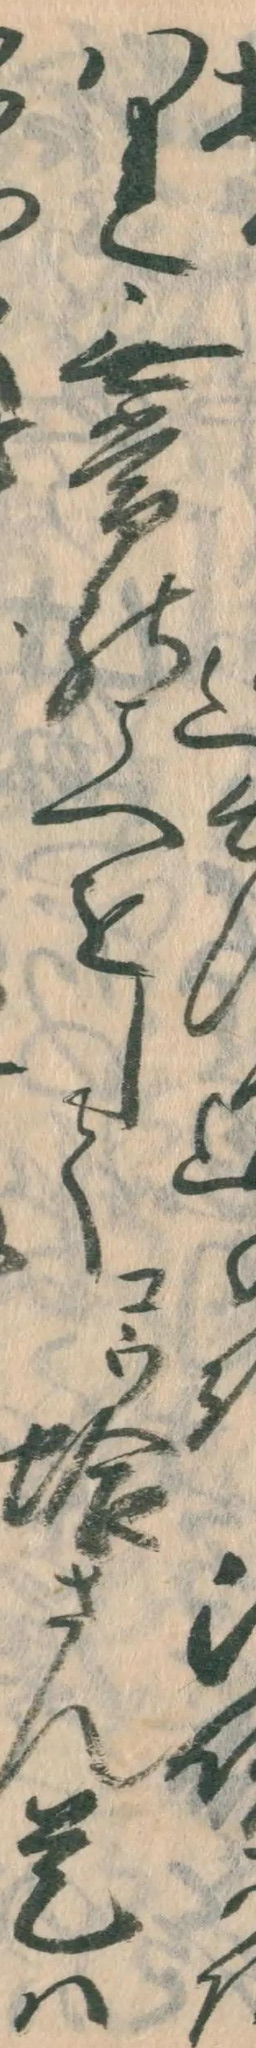ハれ無常のこへをしてコウ蛤さん是ハ
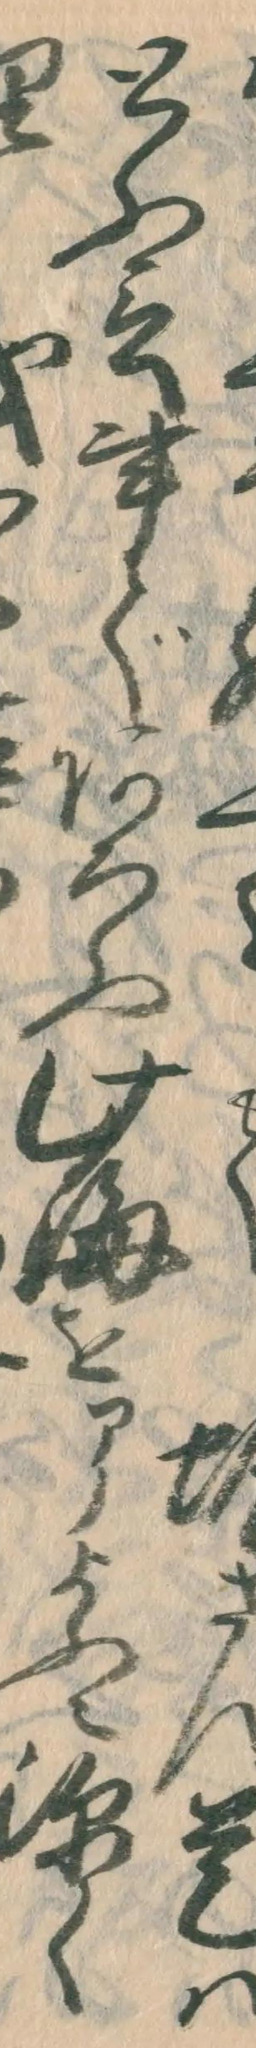とふ云事であろふ此海をアノよふニ深く
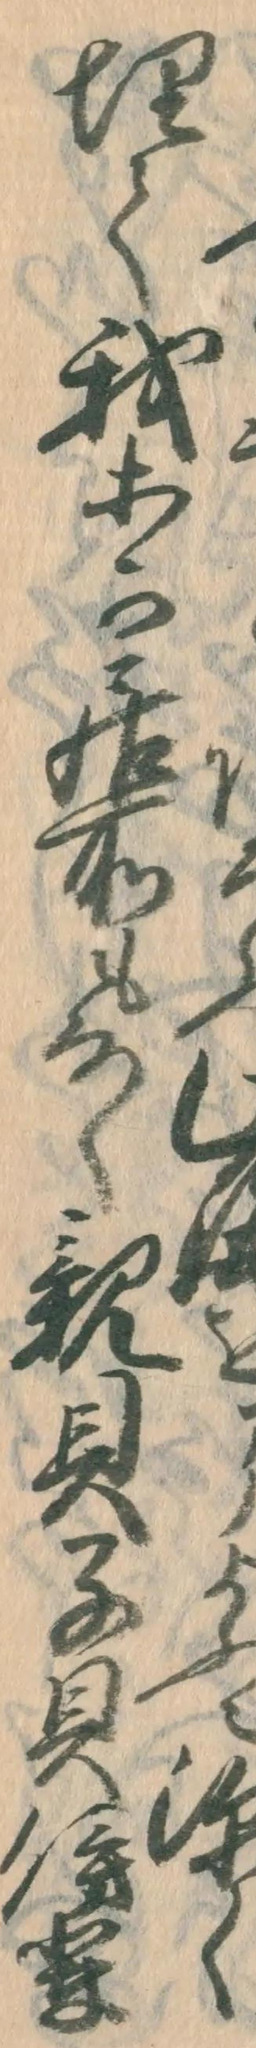埋て我等か居所もなく親貝子貝傍輩

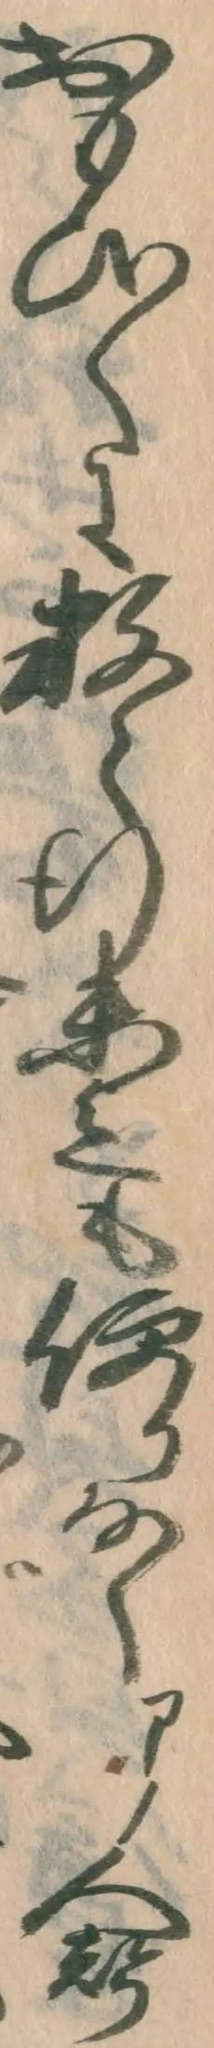おもひ〳〵に数の行末迄も便りなくアノ人聲
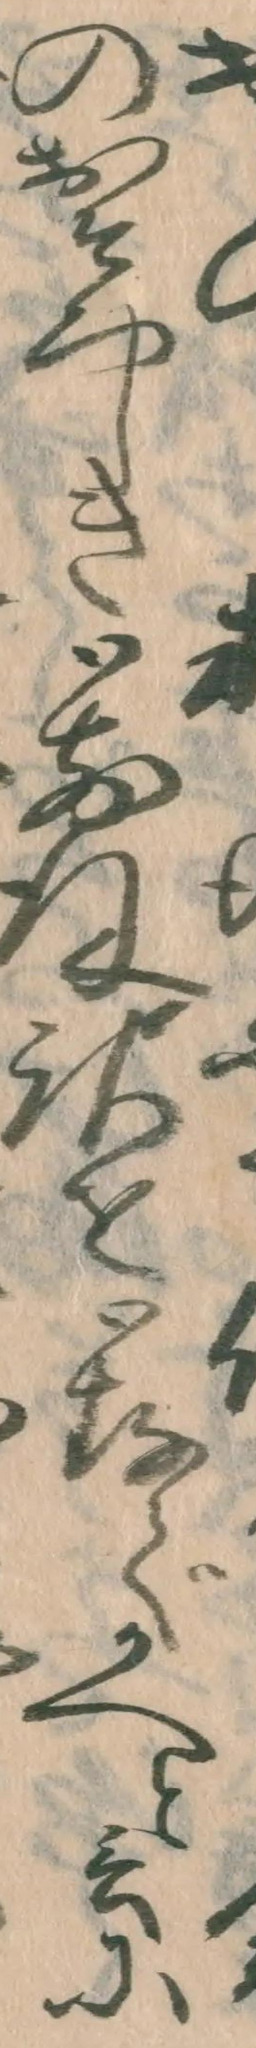のおそろしき御前様訳を御存じかへと云に
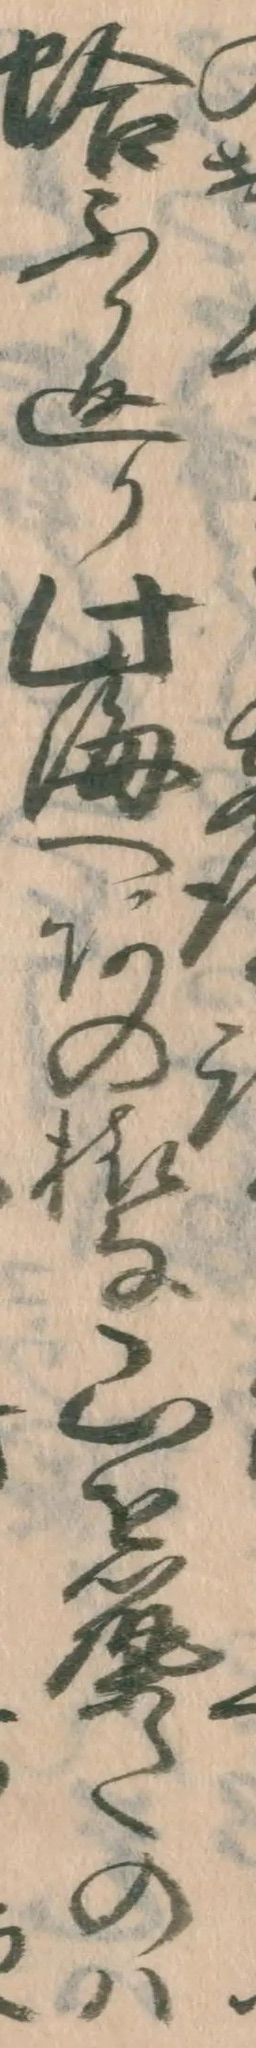蛤ふり返り此海へあの様な山を築たのハ
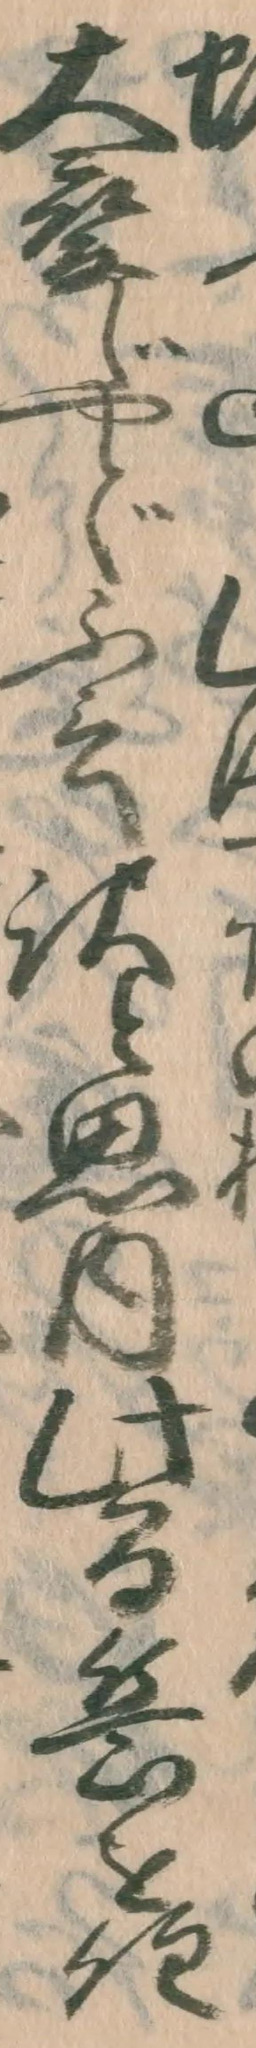大変じやどふ云訳と思内此間岳を住
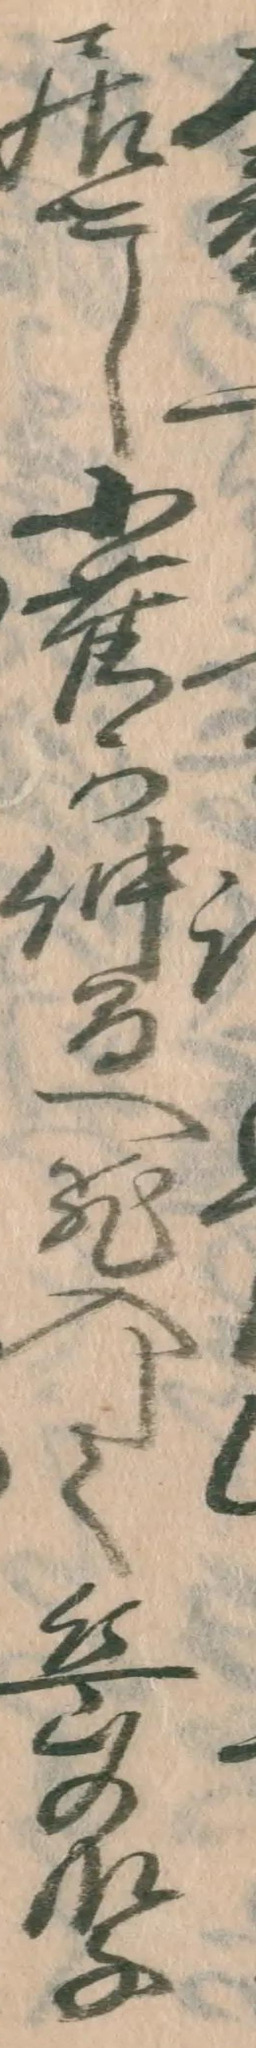居せし小雀か仲間へ飛入して岳の様子
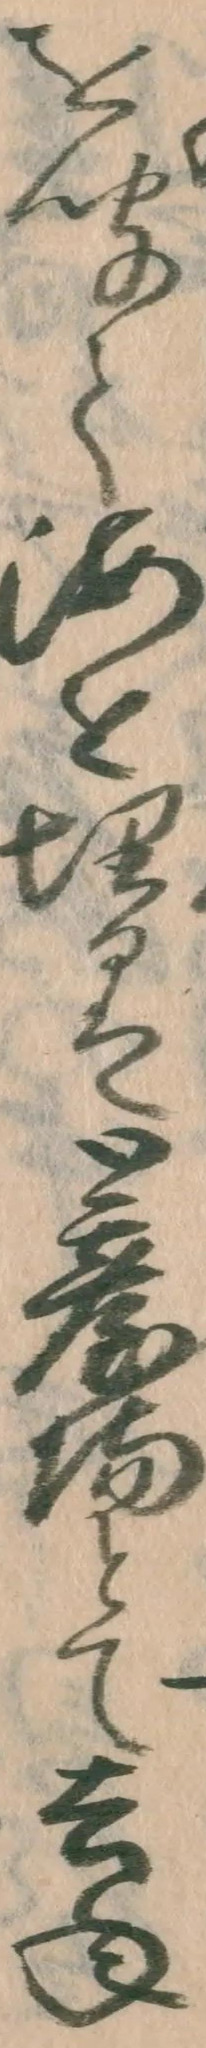を聞て海を埋るは御臺場とて去年
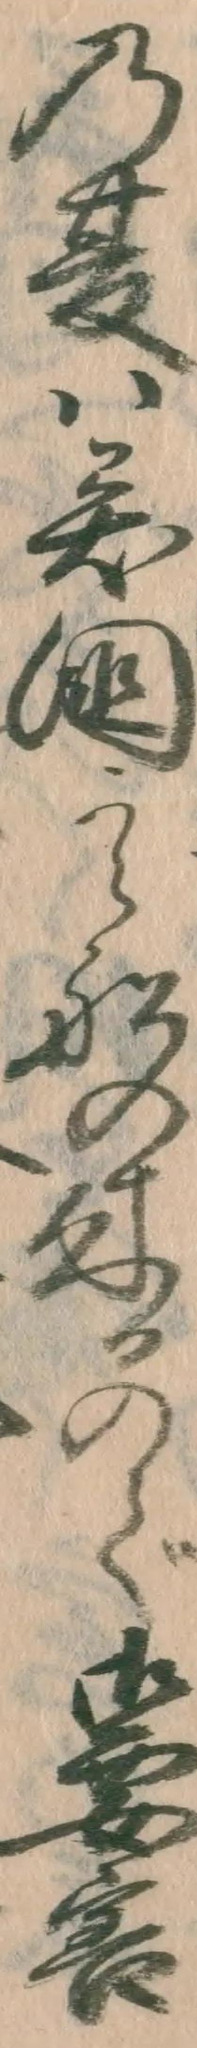の夏ハ異国から船の来るので御要害
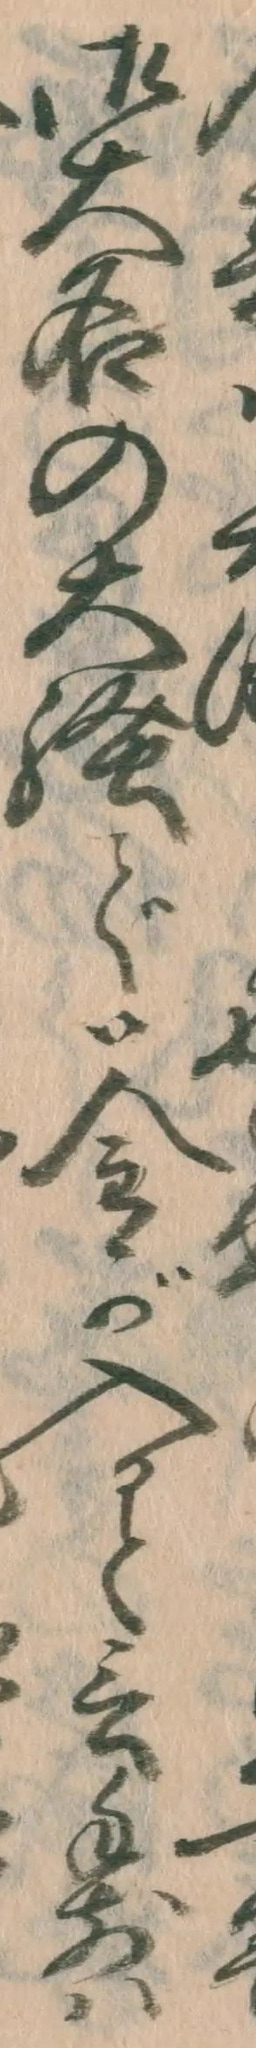御大名の大騒で御金が入ると云手前ハ
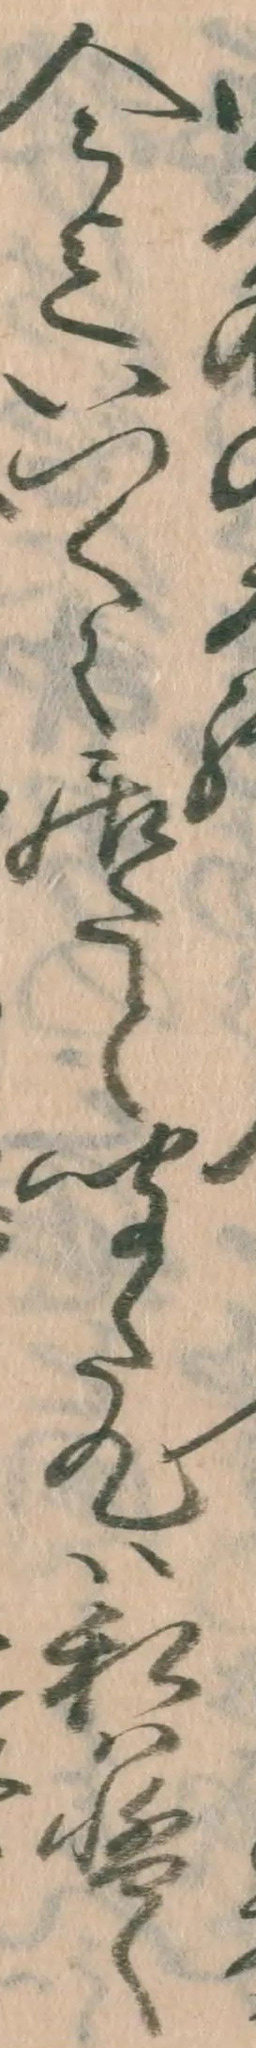今迄いつくに居たと聞たれハ私ハ暫く
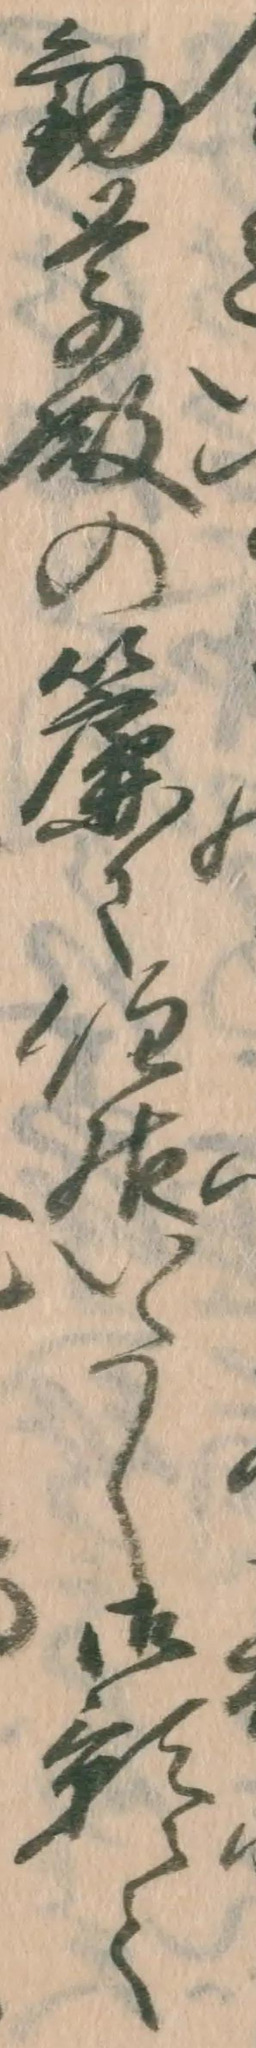勧学殿の簾に住居いたし御影ニて
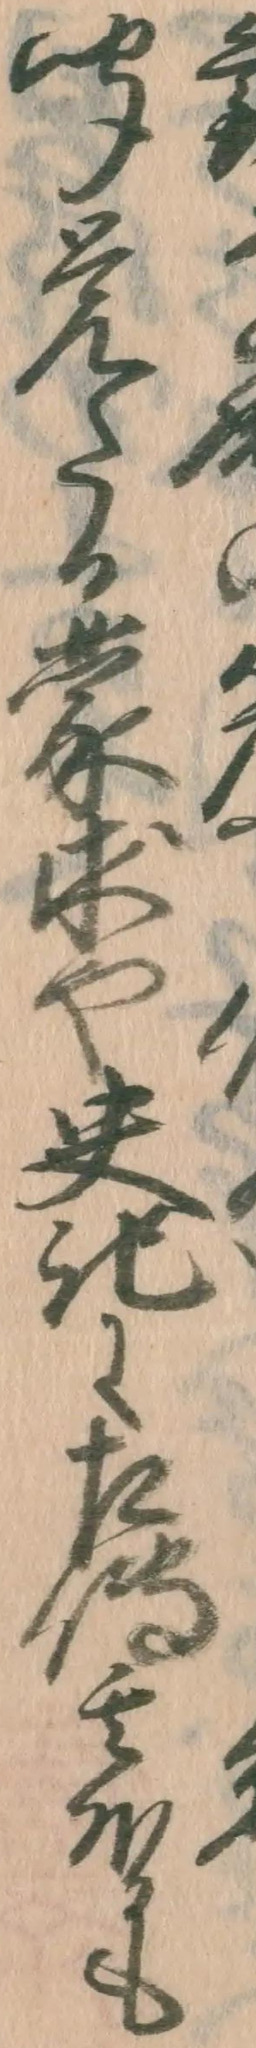聞覚たる蒙求や史記に左傳其外も
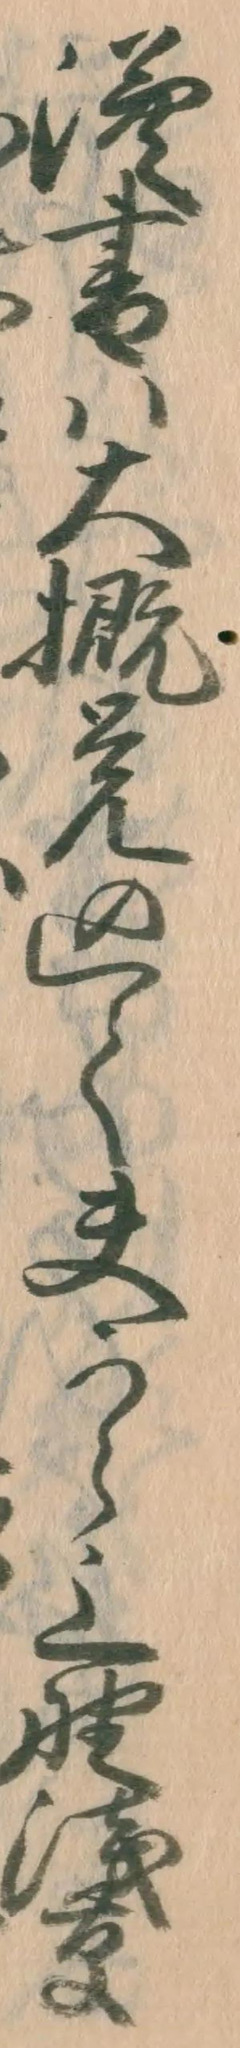読書ハ大概覚込て夫から上野浅草
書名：麗斎叢書. 20
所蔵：国立国会図書館 National Diet Library, JAPAN
